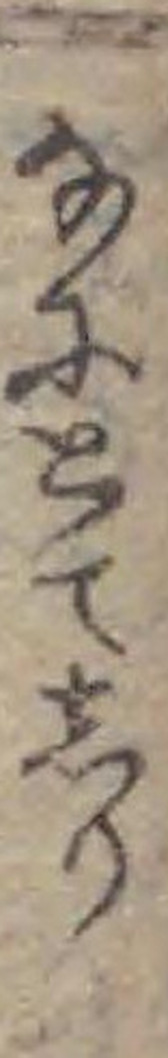なにとてしり
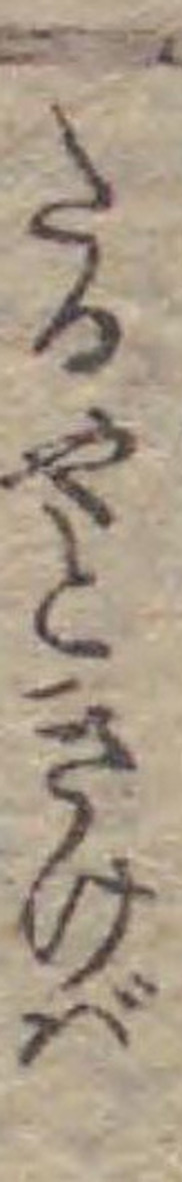たるやときけば
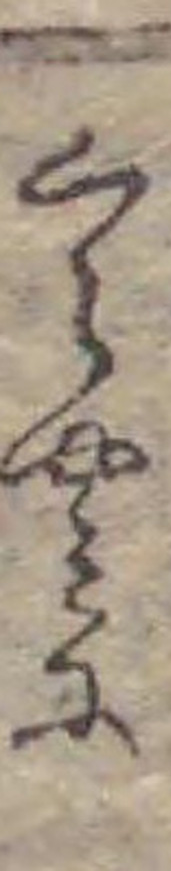くらやみに
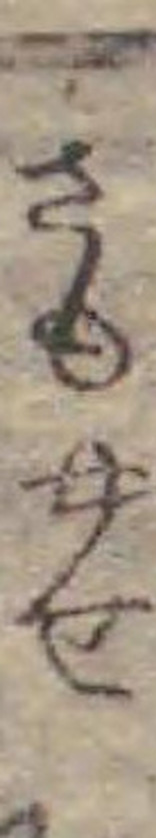さもやせ
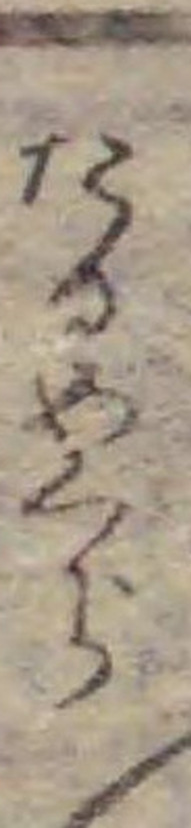たるめくら
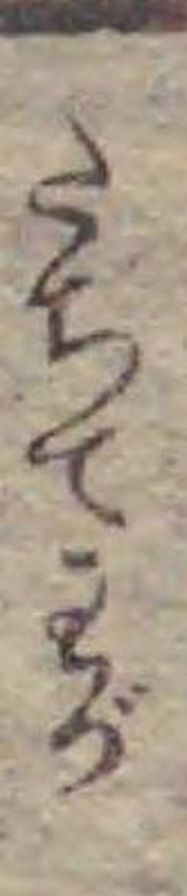たちてわが
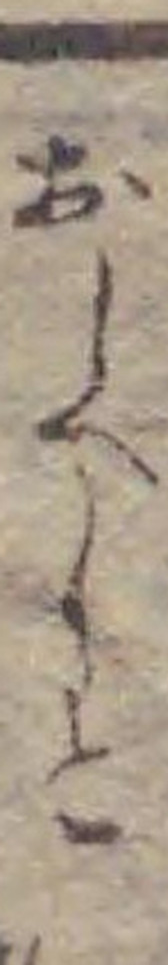おしへしと
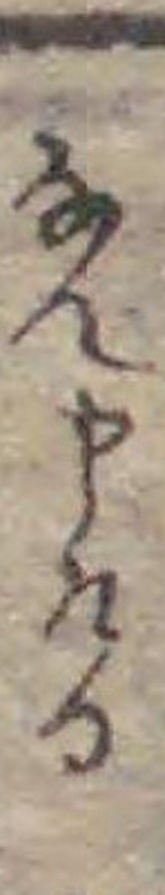なん申ける

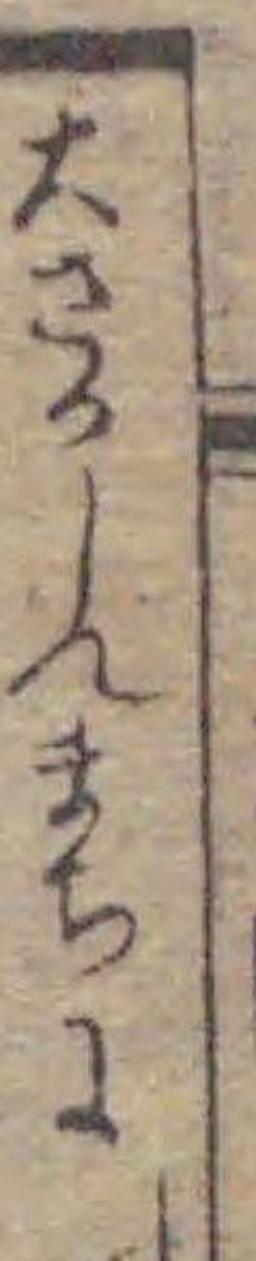大さかしんまちに
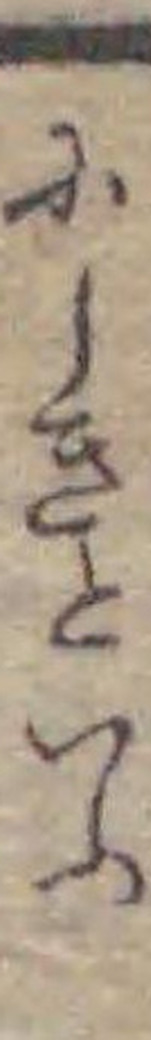にしきといふ
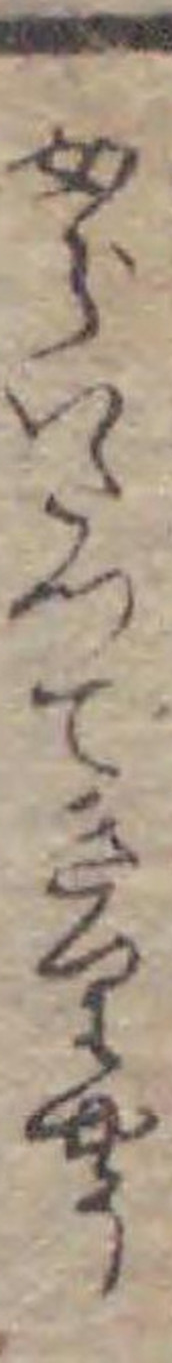女郎いたつてきりやう
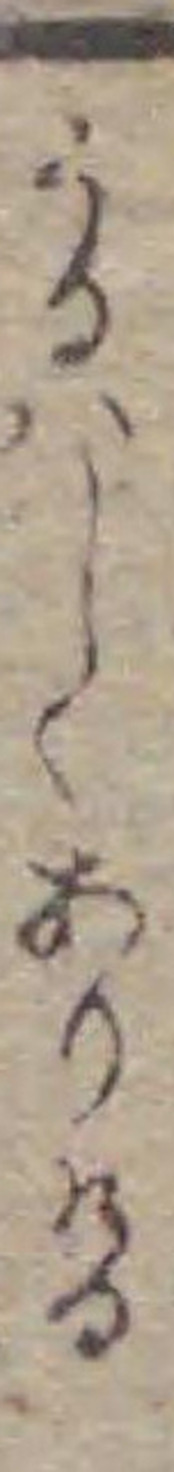うるはしくありける
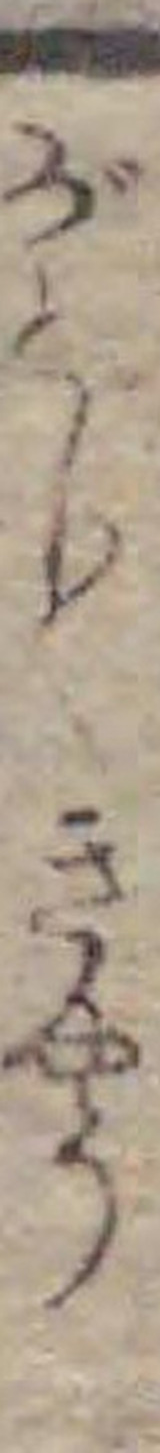がとし〳〵きやう
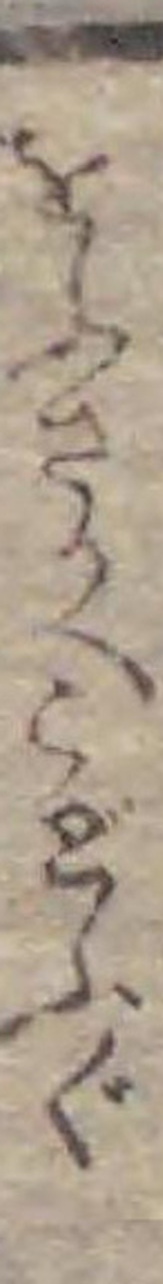をふさかへこどふぐ
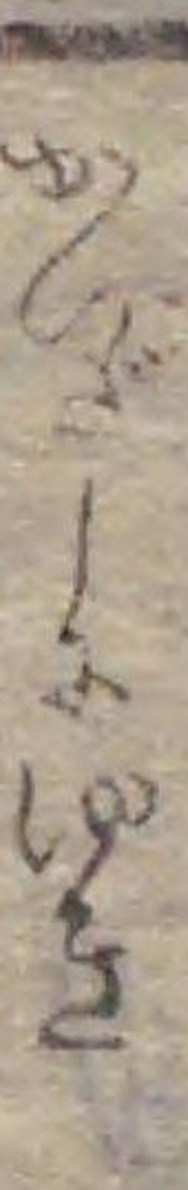かいだしにゆき
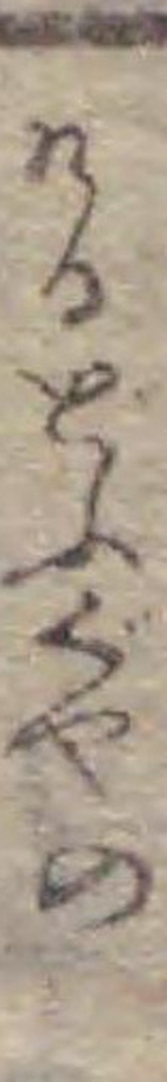けるとふぐやの
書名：変化物春遊 : 2巻
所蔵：国立国会図書館 National Diet Library, JAPAN
